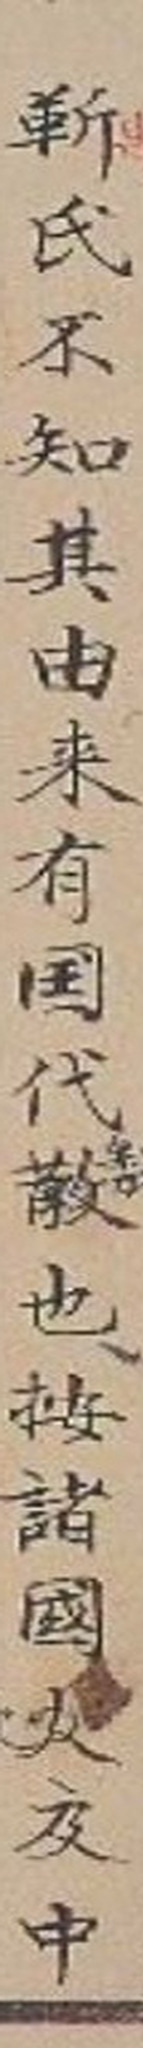靳斯氏不知其由来有国代数也、按諸国史、及中
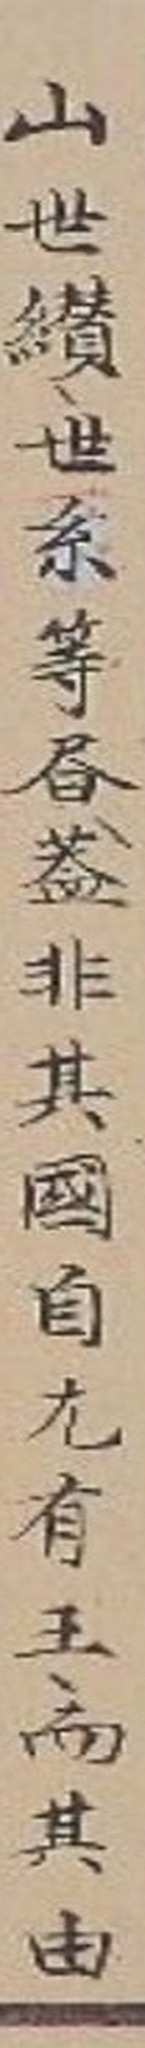山世纘、世系等、蓋非其国自尢有王、而其由
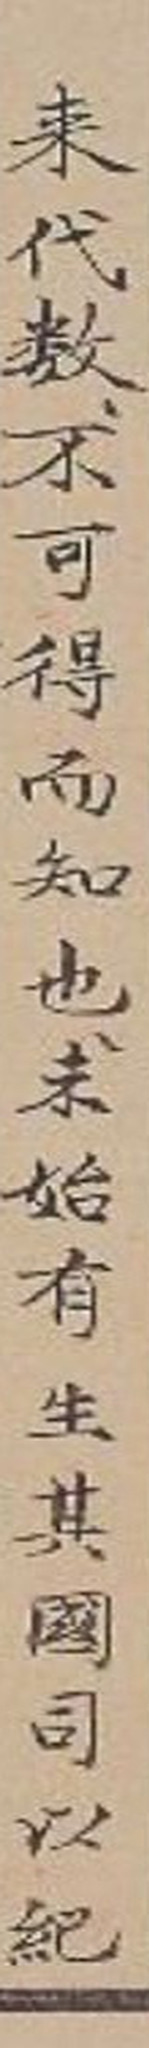来代数、不可得而知也、未始有生其国司以紀
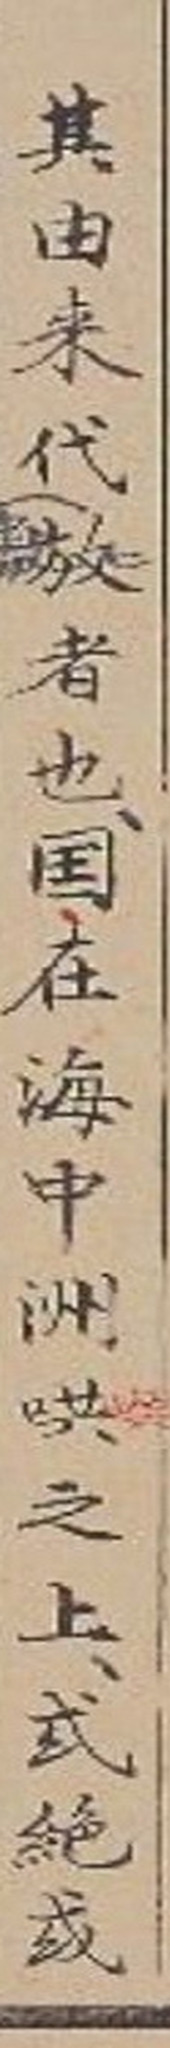其由来代数者也、国在海中洲哄嶼之上、或絶或
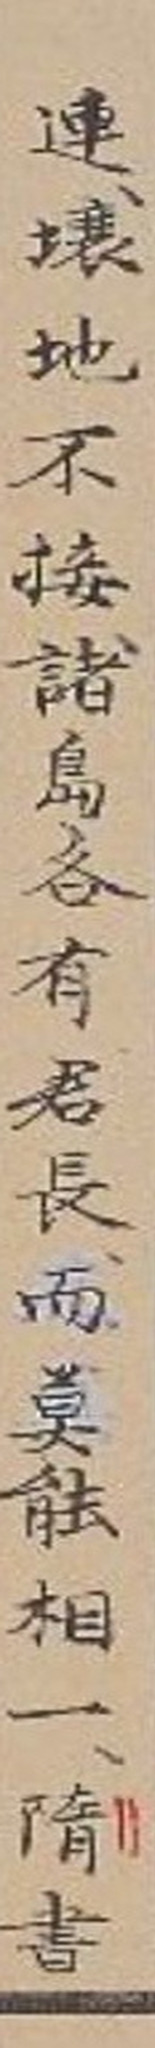連、壤地不接、諸島各有君長、而莫能相一、隋書
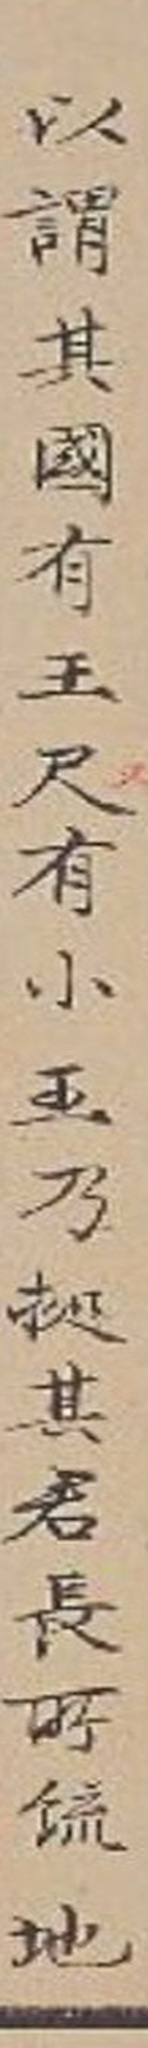以謂其国有王尺又有小王乃拠其君長所锍地
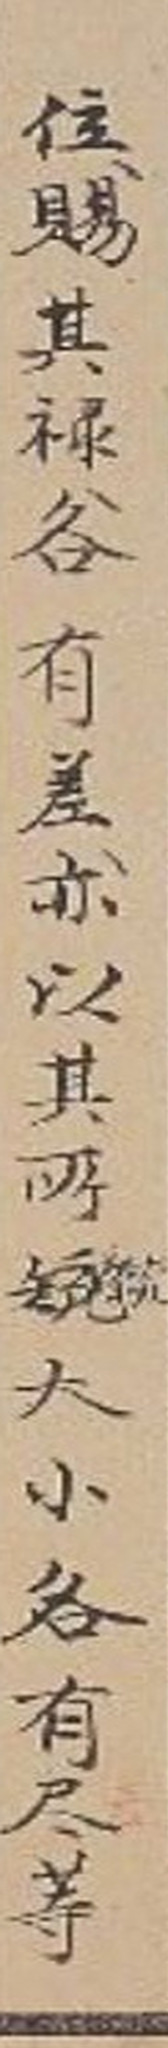位、賜其禄、各有差、亦以其所統大小各有尽等
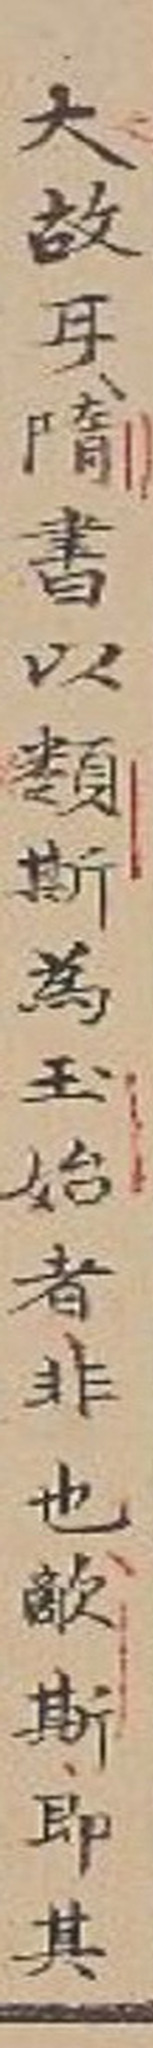大之故耳、隋書以類斯為玉始者非也、歒斯、即其
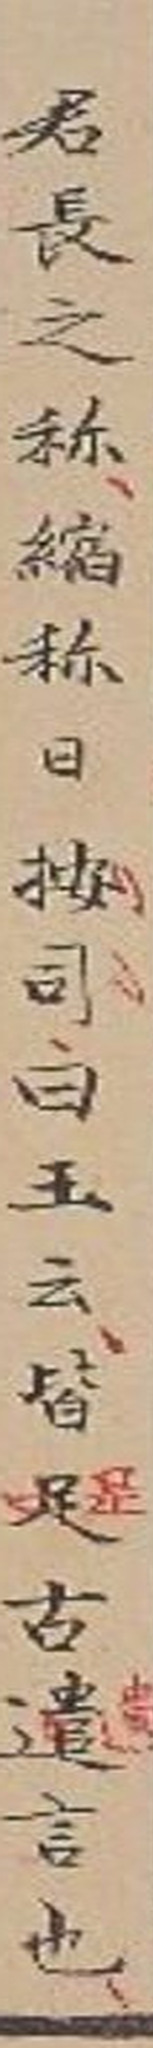君長之称、縮称曰按司、曰王云、皆足是古遣遺言也、
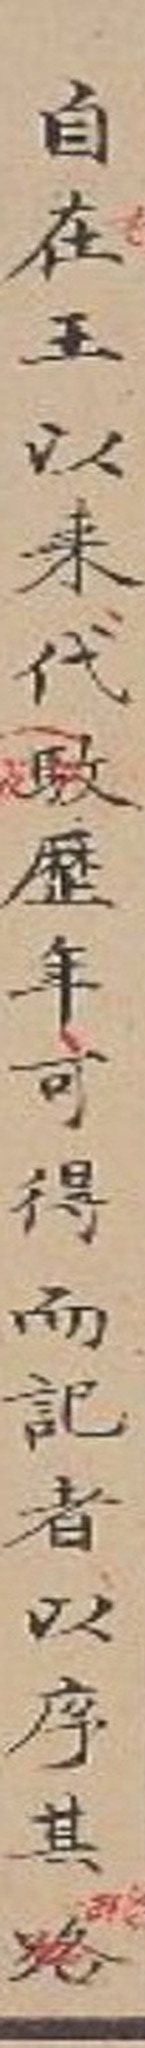自在有王以来代数歴年、可得而記者、以序其略
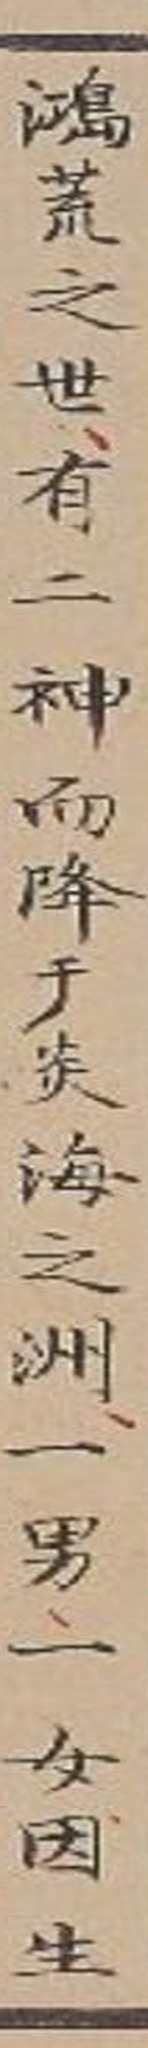鴻荒之世、有二神而降于炎海之洲、一男、一女因生
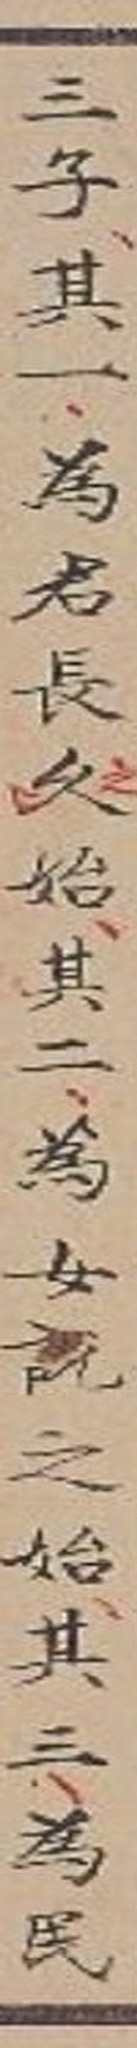三子、其一、為君長久之始、其二、為女説之始、其三、為民

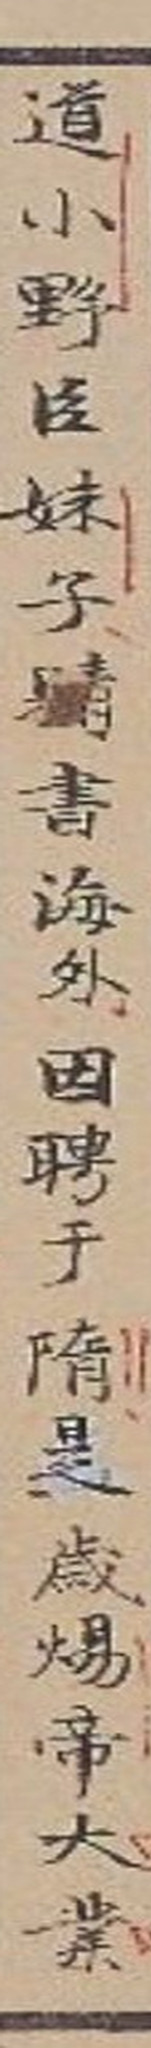遣小野臣妹子、購書海外、因聘于隋、是歳煬帝大業
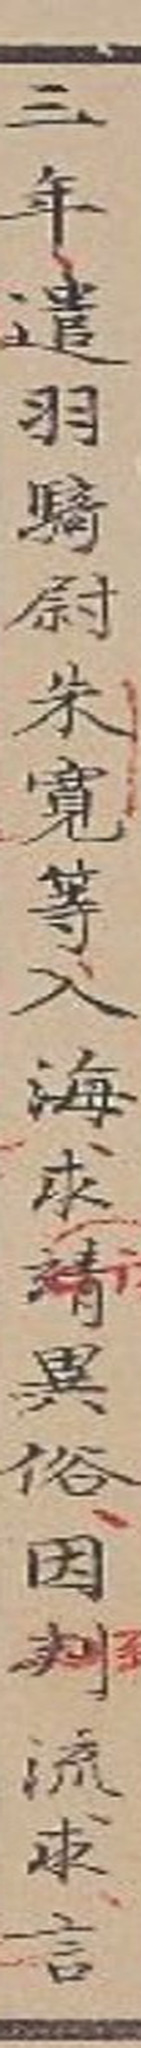三年、遣羽騎尉朱寛等、入海求靖訪異俗、因到流求、言
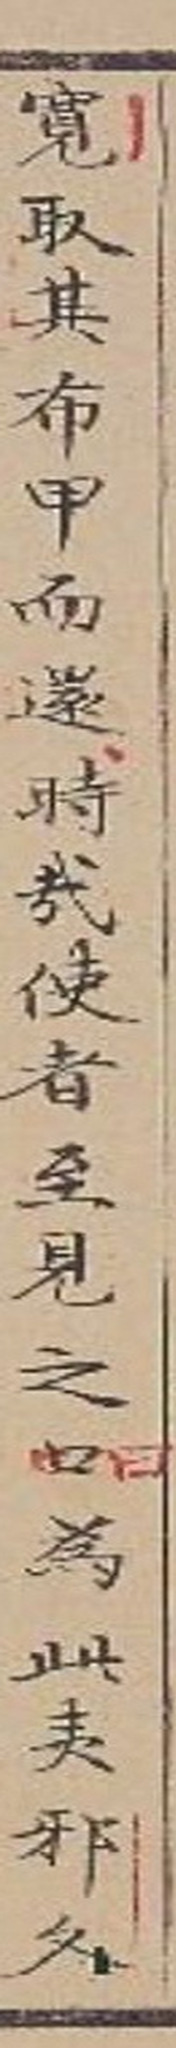寛取其布甲而還、時哉使者至見之口曰為此夷邪久
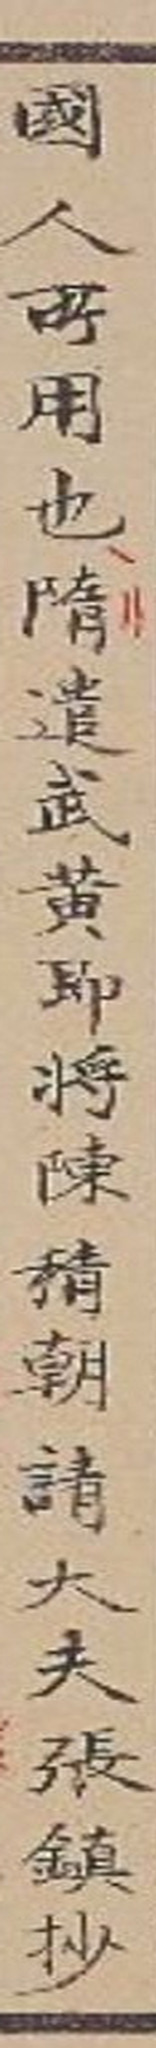国人所用也、隋遣武黄即将陳朝請大夫張鎮抄
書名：南島志 全
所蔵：University of the Ryukyus Library
